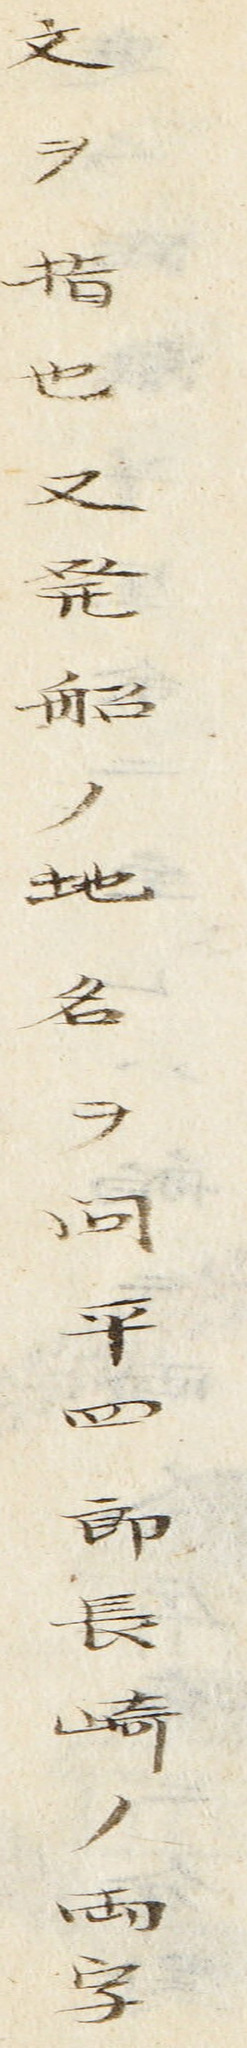文ヲ指也又発船ノ地名ヲ問平四郎長崎ノ両字
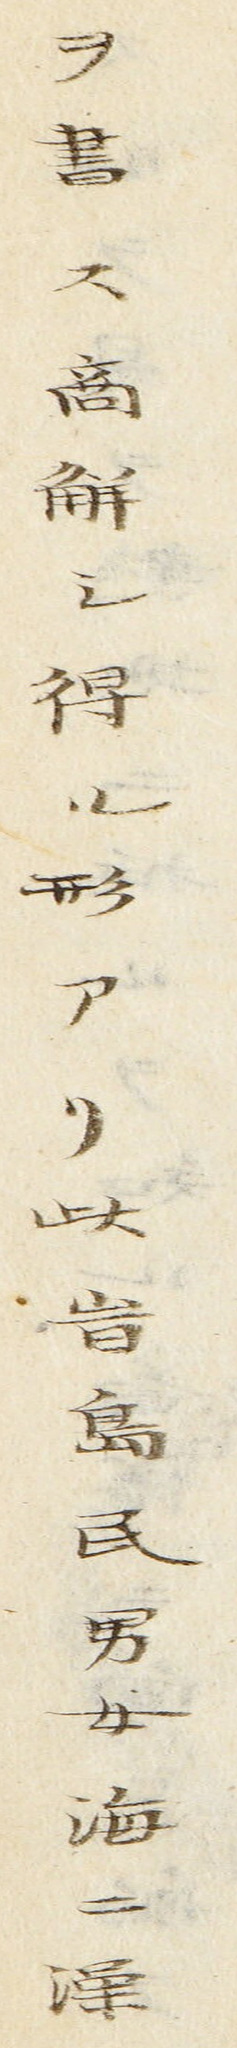ヲ書ス商觧シ得ル形アリ此旹島民男女海ニ澡

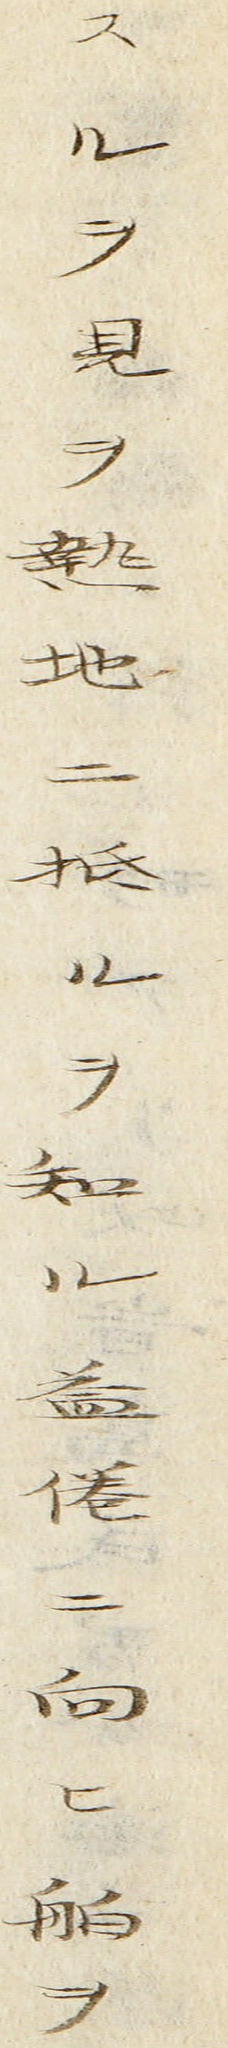スルヲ見ヲ熱地ニ抵ルヲ知ル益倦ニ向ヒ舶ヲ
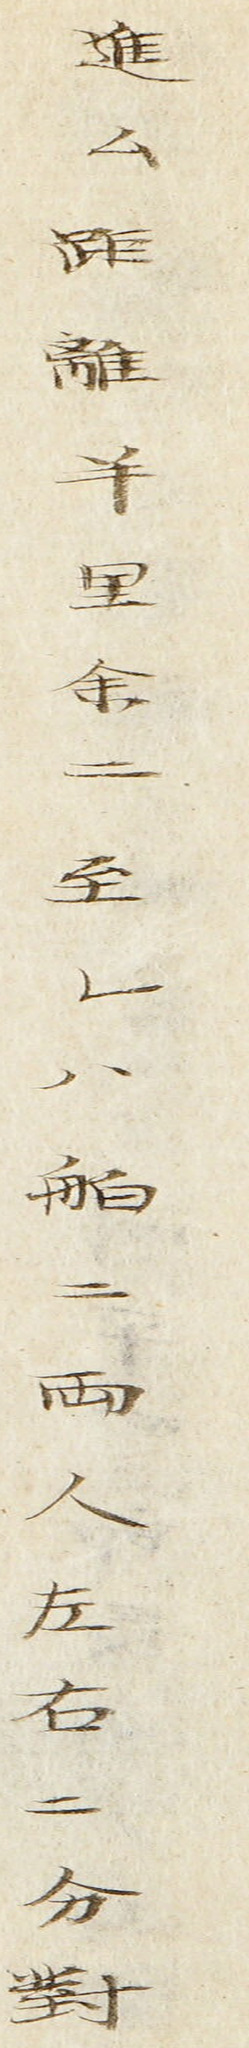進ム距離半里余ニ至レハ舶ニ両人左右ニ分対
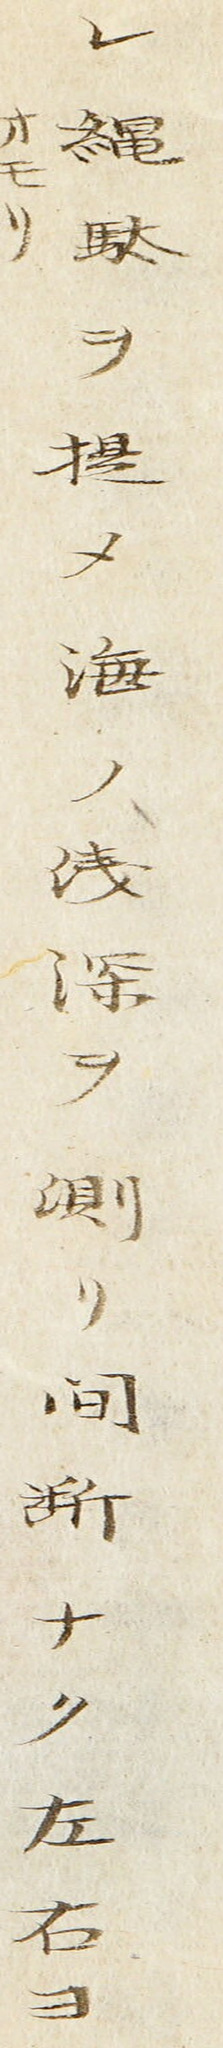レ縄駄ヲ提シテ海ノ浅深ヲ測リ間断ナク左右ヨ
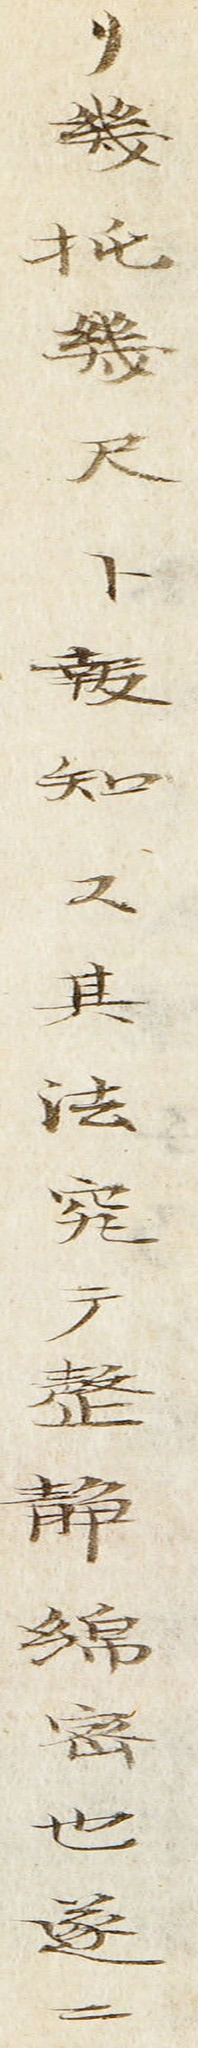リ幾托幾尺ト報知ス其法究テ整静綿密也遂ニ
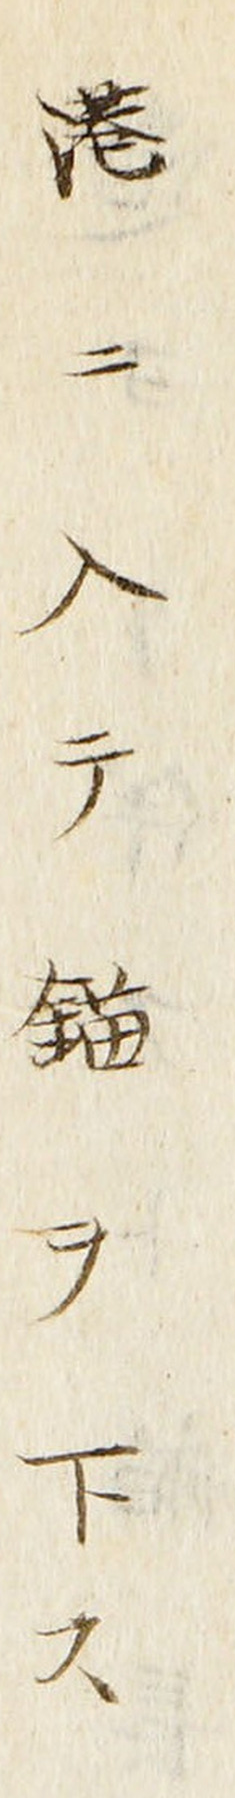港ニ入テ錨ヲ下ス
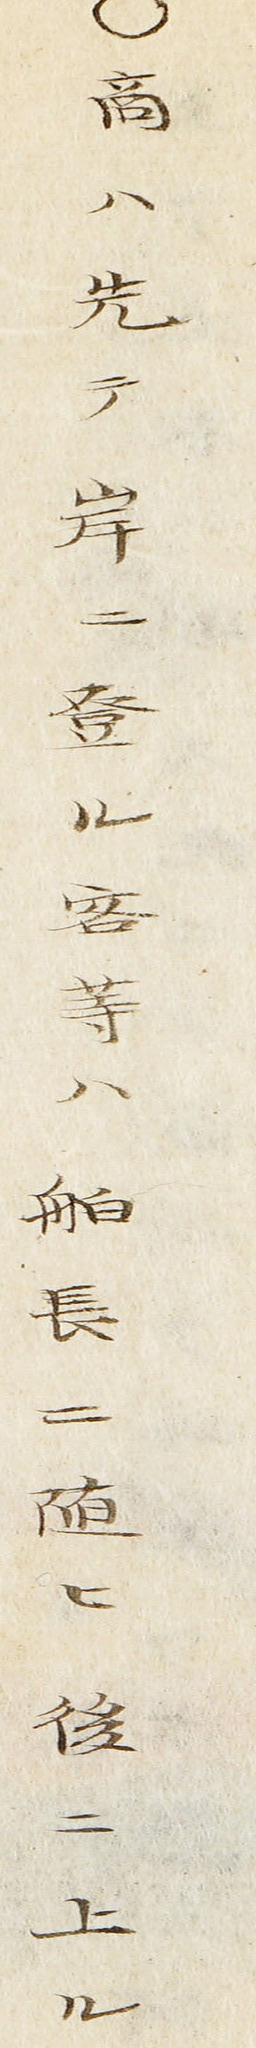○商ハ先テ岸ニ登ル客等ハ舶長ニ随ヒ後ニ上ル
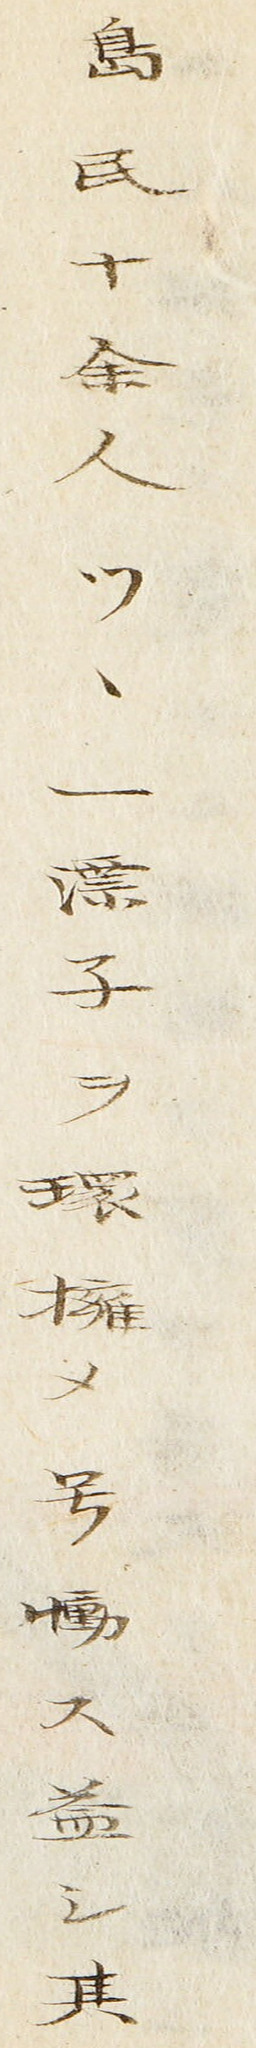島民十余人ツヽ一漂子ヲ環擁シテ号慟ス益シ其
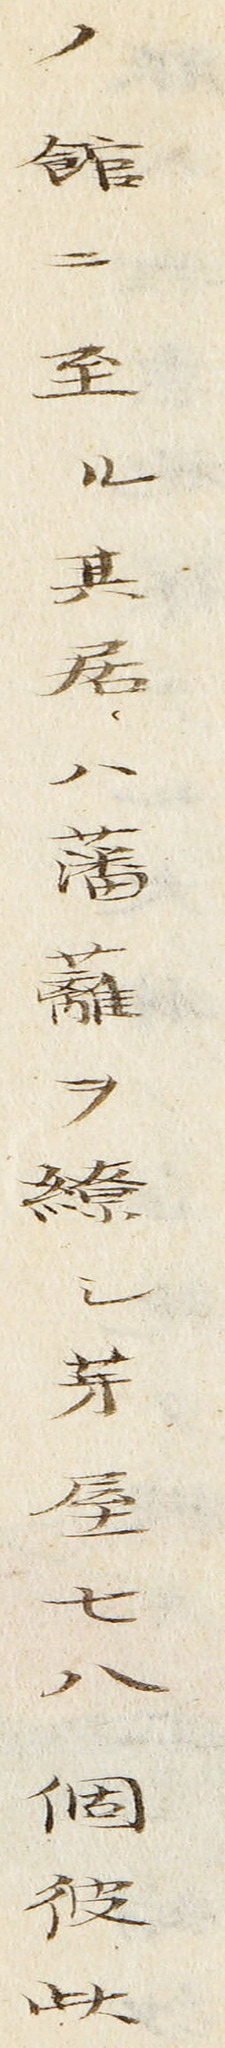ノ館ニ至ル其居ハ藩蘺ヲ繚シ茅屋七八個彼此
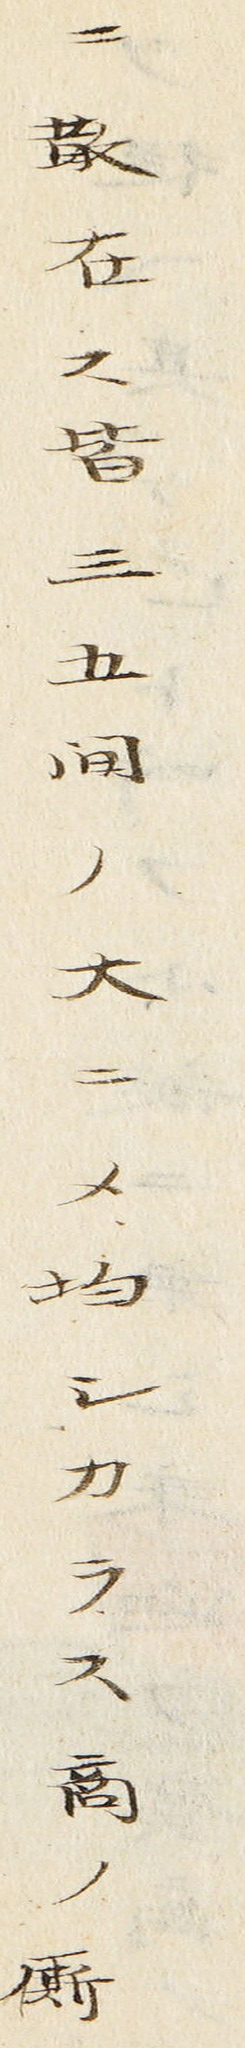ニ散在ス皆三五間ノ大ニシテ均シカラス商ノ厮
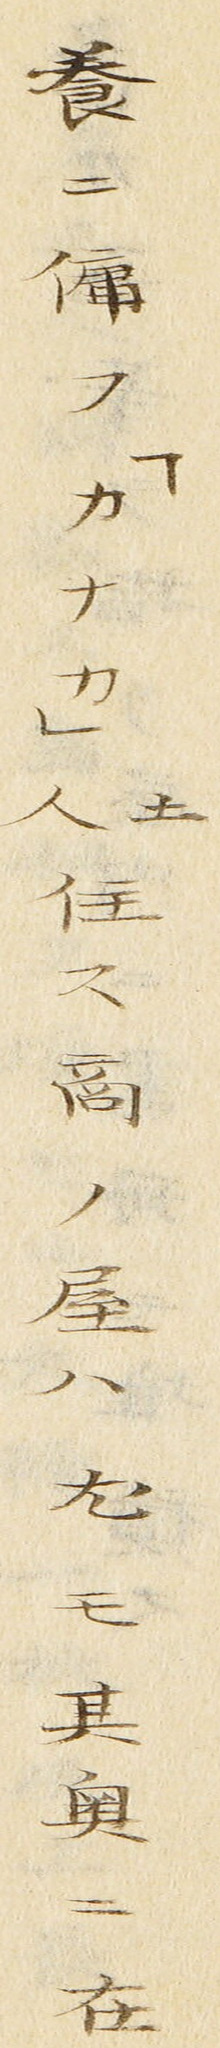養ニ傭フ「カナカ」土人住ス商ノ屋ハ尤モ其奥ニ在
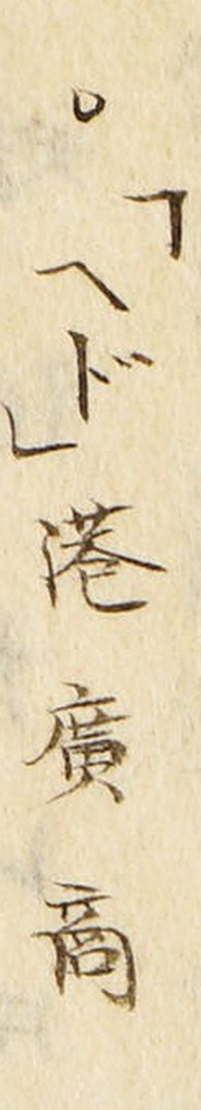◦「ヘド」港広商
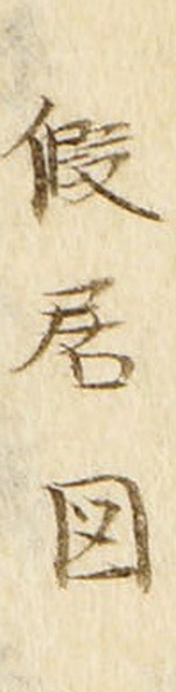仮居図

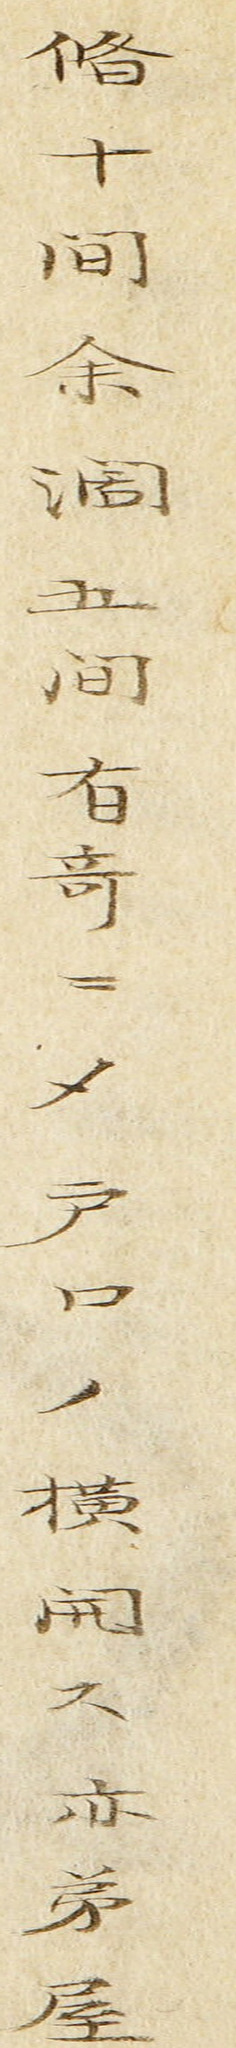脩十間余濶五間有奇ニシテ戸口ノ横開ス亦茅屋
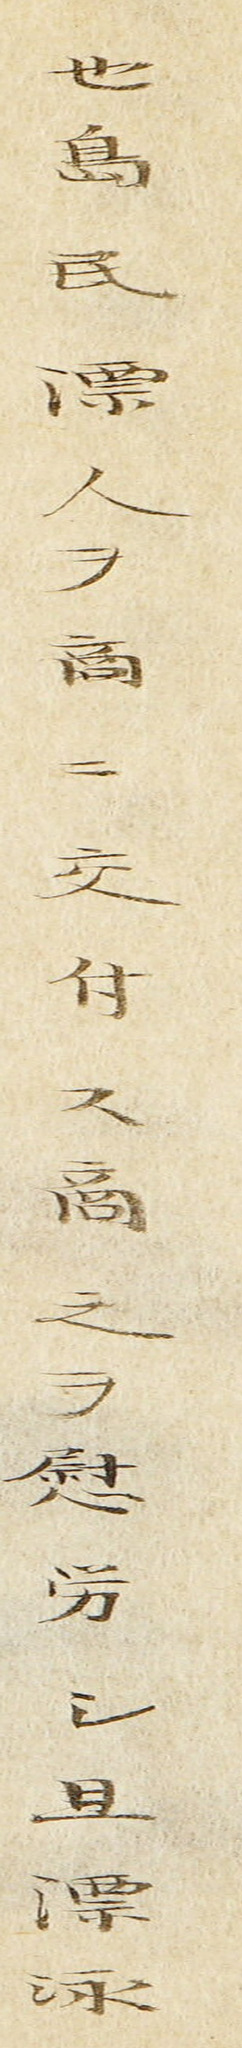也島民漂人ヲ商ニ交付ス商之慰労シ且漂泳
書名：流蕃通書
